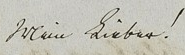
Mein Lieber!
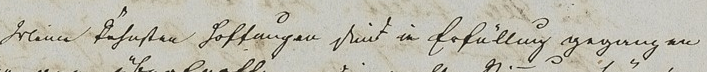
Meine kühnsten Hoffnungen sind in Erfüllung gegangen
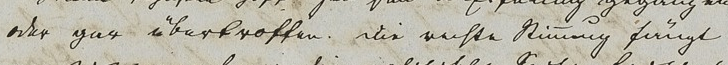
oder gar übertroffen. Die rechte Stimmung fängt
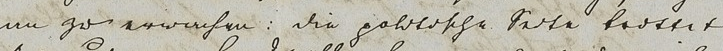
an zu erwachen: die politische Seite trittet
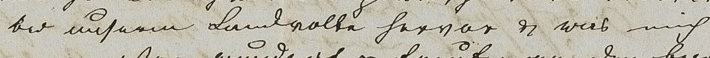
bei unserm Landvolke hervor & was mich
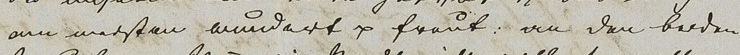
am meisten wundert & freut: an den beiden
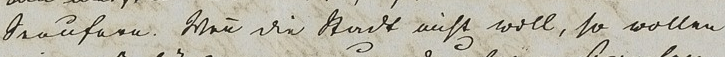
Seeufern. Wenn die Stadt nicht will, so wollen
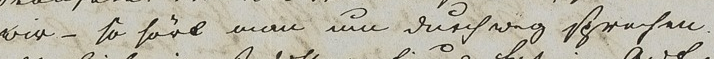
wir – so hört man nun durchweg sprechen.
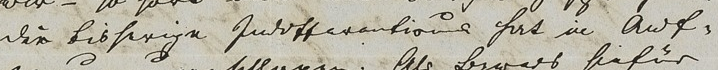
Der bisherige Indifferentismus hat in Auf-
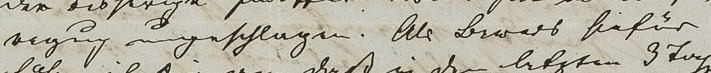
regung umgeschlagen. Als Beweis hiefür
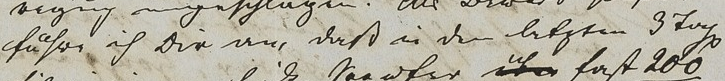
führe ich Dir an, daß in den letzten 3 Tagen
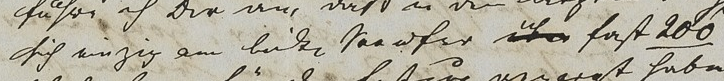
sich einzig am linken Seeufer über fast 200
